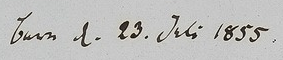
Bern d. 23. Juli 1855.
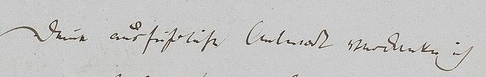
Deine ausführliche Antwort verdanke ich
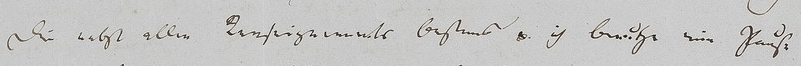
Dir nebst allen Renseignements bestens &. ich benutze eine Pause
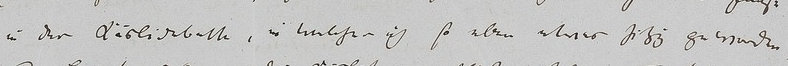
in der Käslidebatte, in welcher ich so eben etwas hitzig geworden,
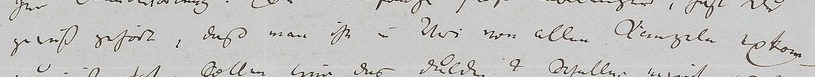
gewiß gehört, daß man ihn in Uri von allen Kanzeln exkom-
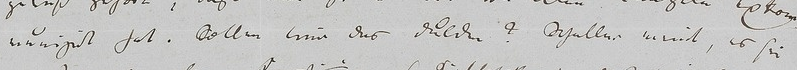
munizirt hat. Sollen wir das dulden? Schaller meint, es sei
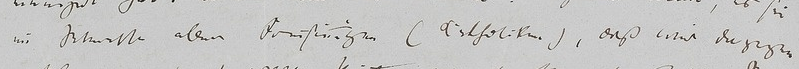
im Interesse aller Freisinnigen (Katholiken), daß wir dagegen
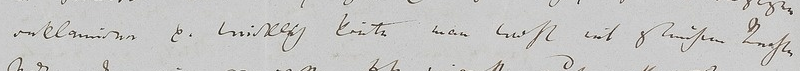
reklamiren &. wirklich könnte man wohl mit gleichem Rechte
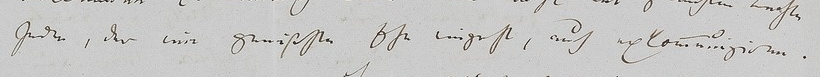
Jeden, der eine gemischte Ehe eingeht, auch exkommuniziren.
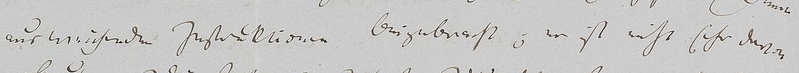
ausweichenden Instruktionen beigebracht; er ist nicht sehr davon
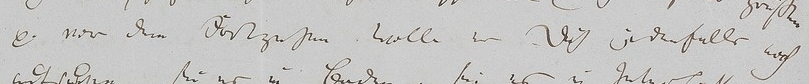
&. vor dem Fortgehen wolle er Dich jedenfalls noch
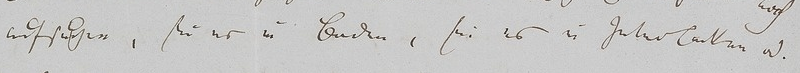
aufsuchen, sei es in Baden, sei es in Interlaken od.
